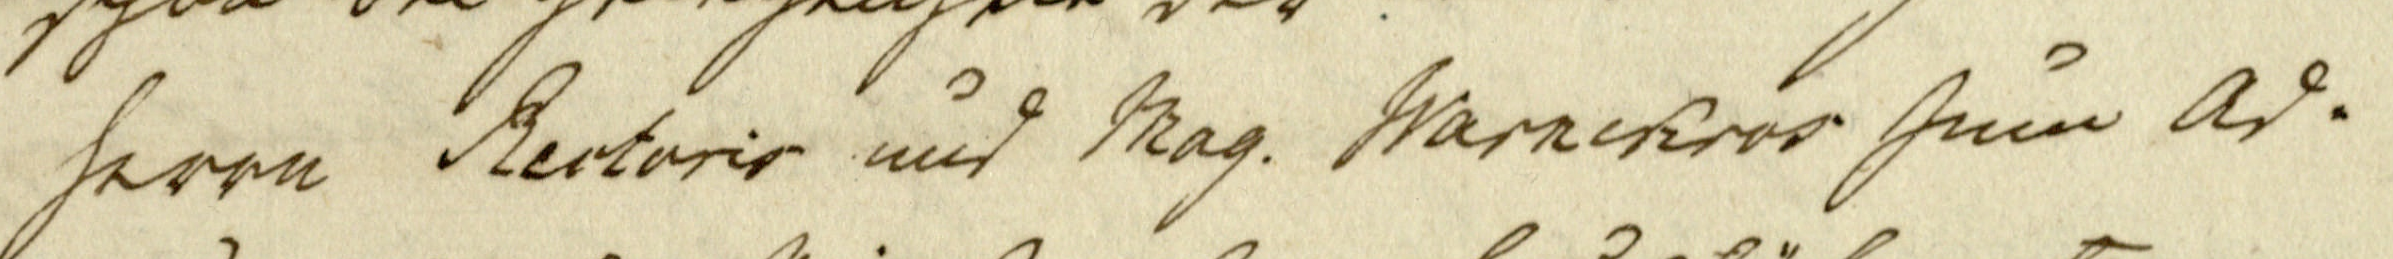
herrn Rectoris und Mag. Warnekros zum Ad¬
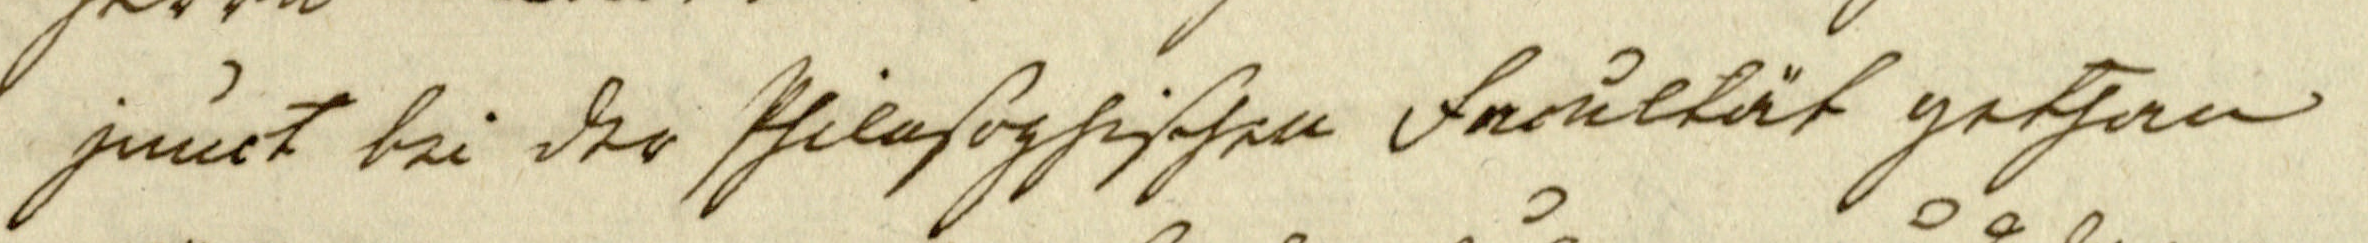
junct bei der Philosophischen Facultät gethan
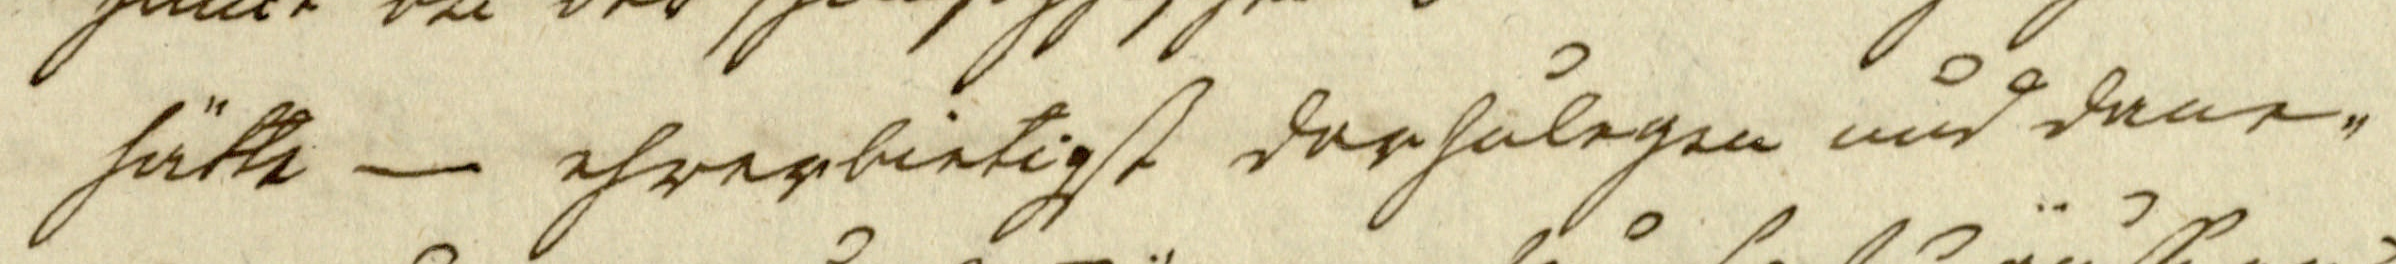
hätte ehrerbietigst darzulegen und dane¬
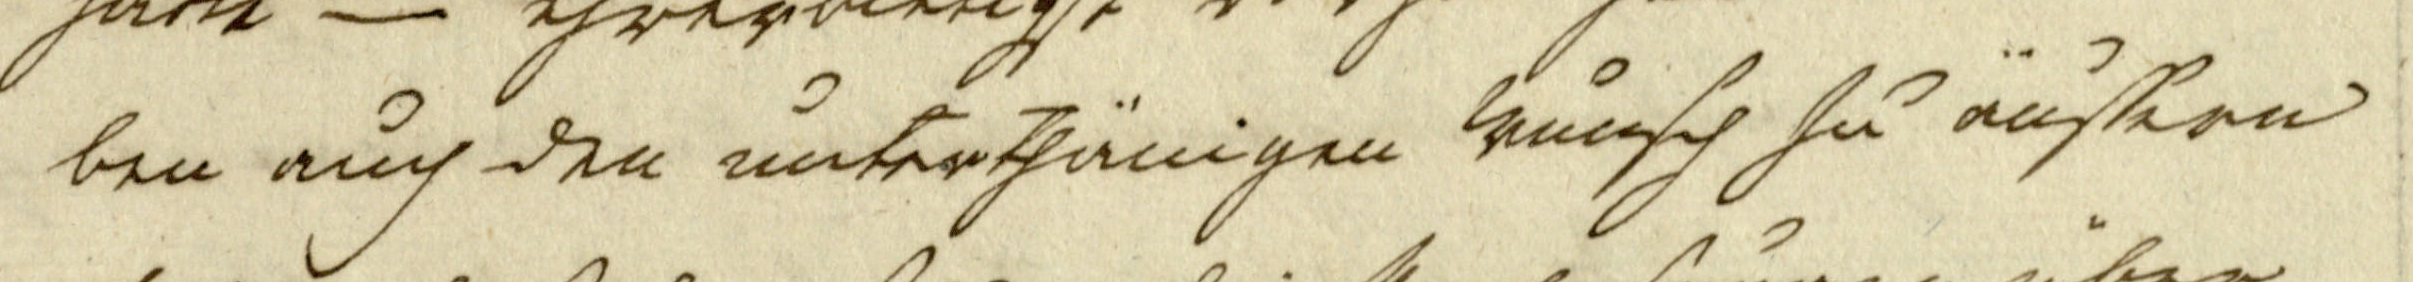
ben auch den unterthänigen Wunsch zu äussern
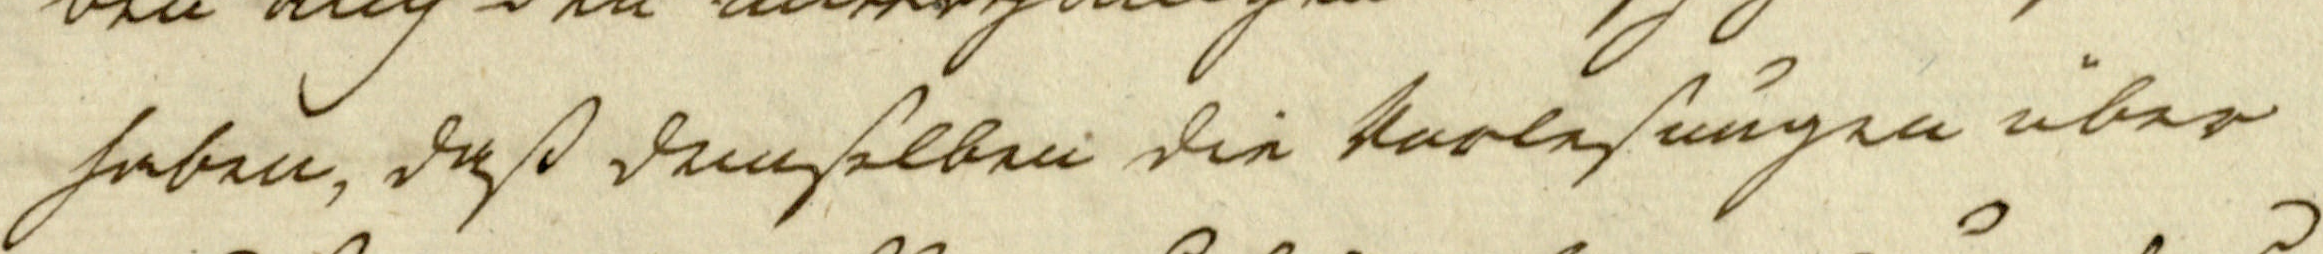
haben, daß demselben die Vorlesungen über
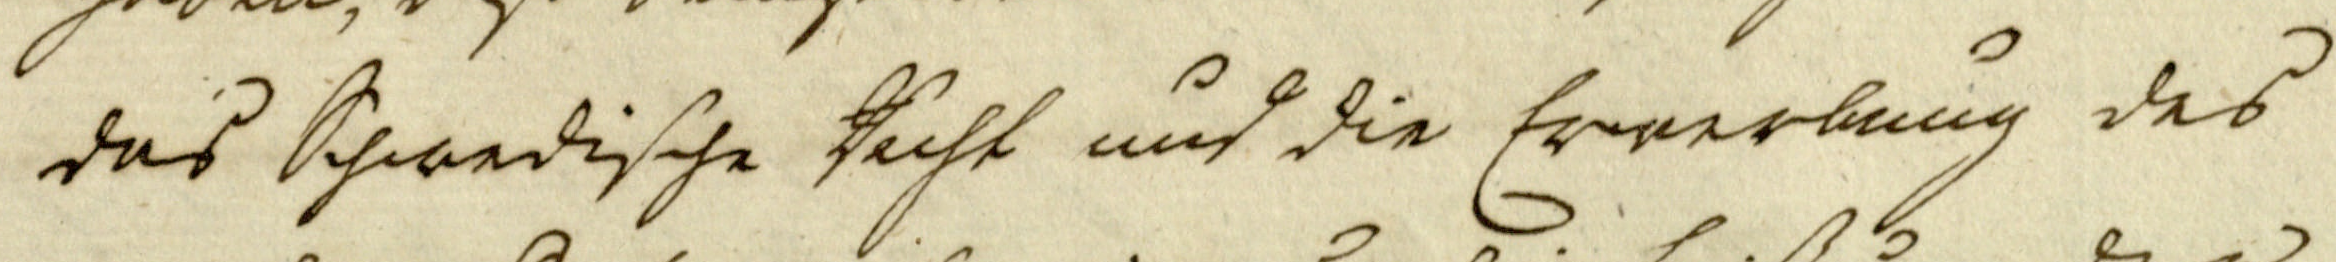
das Schwedische Recht und die Erwerbung des
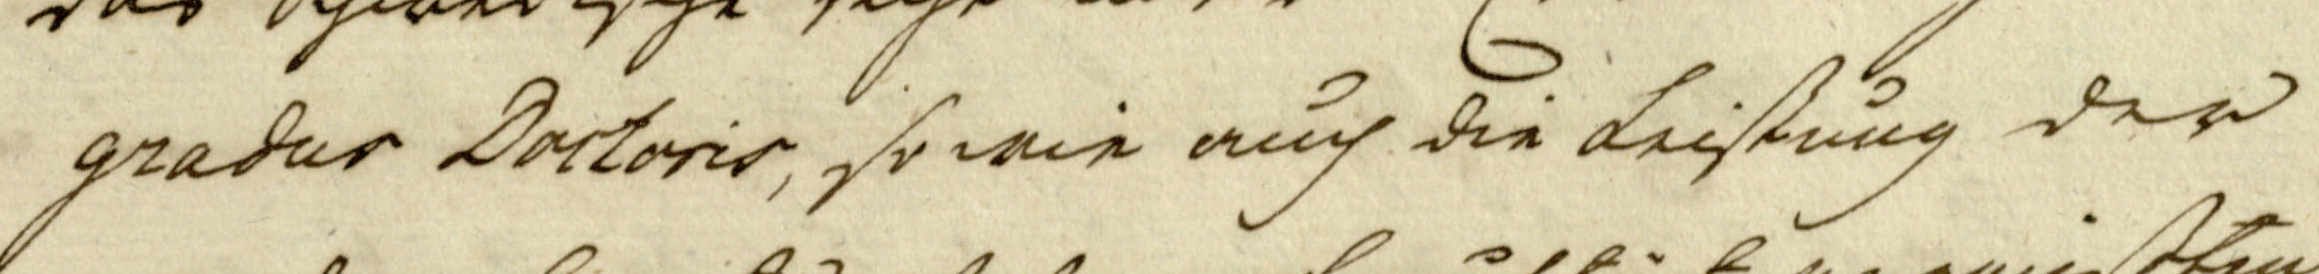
gradus Doctoris, so wie auch die Leistung der
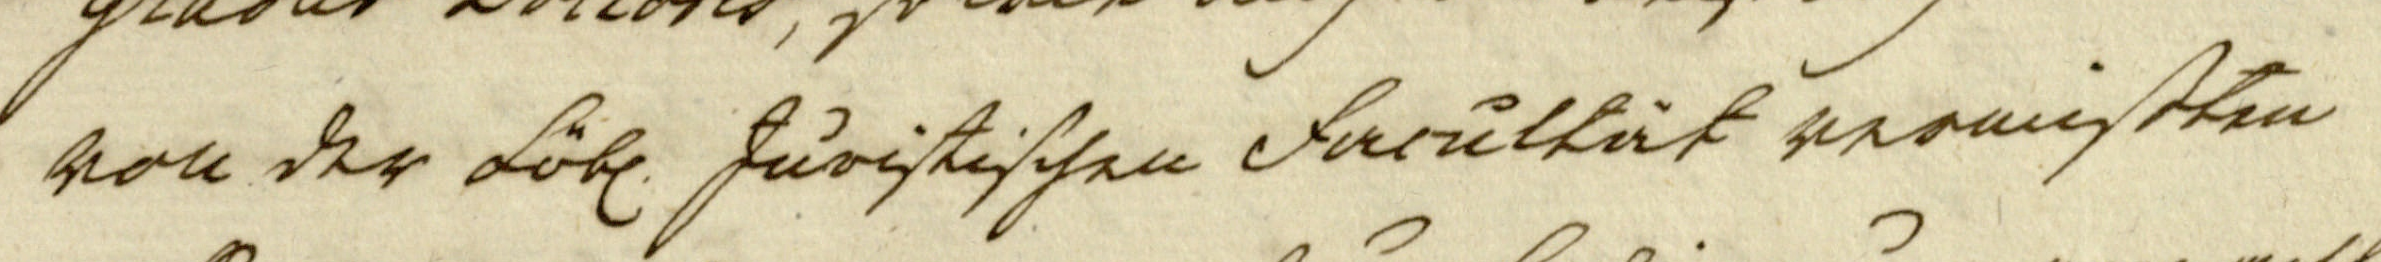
von der Löbl. Juristischen Facultät vermißten
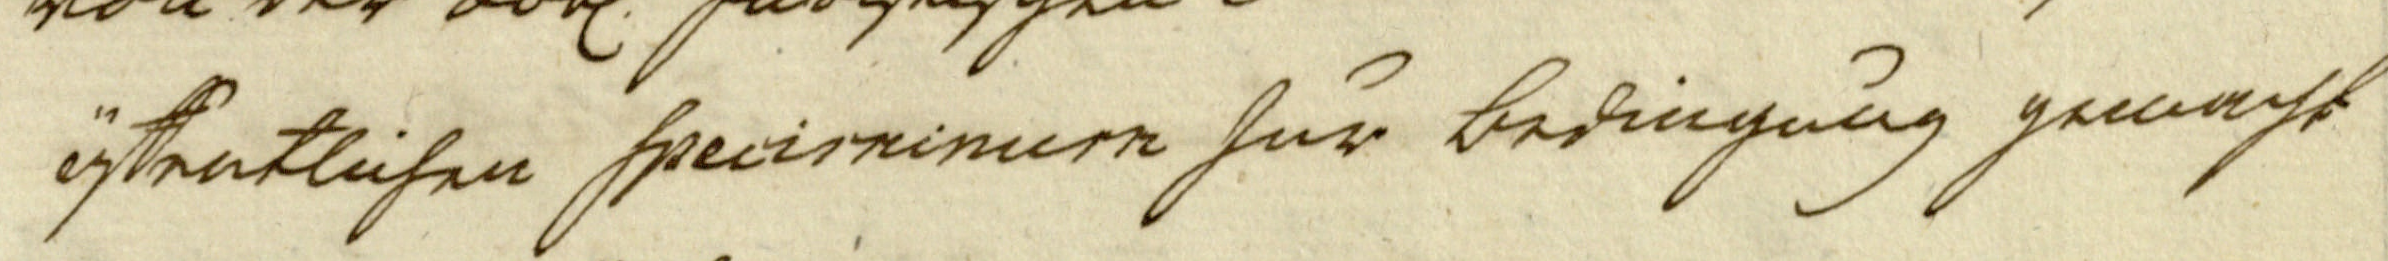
öffentlichen speciminum zur Bedingung gemacht
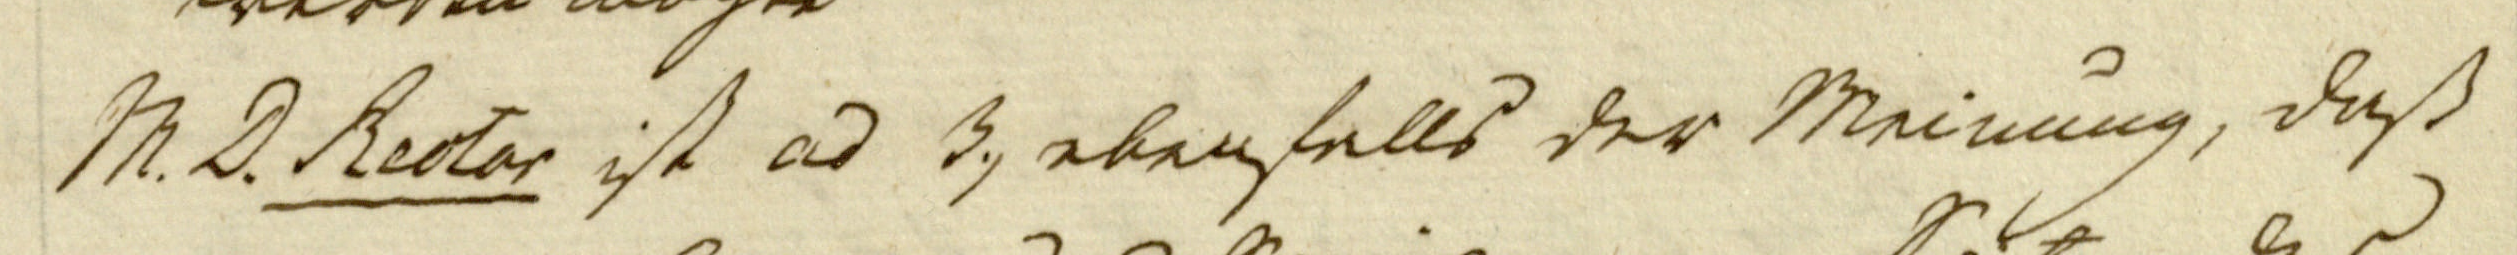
M. D. Rector ist ad 3., ebenfalls der Meinung, daß
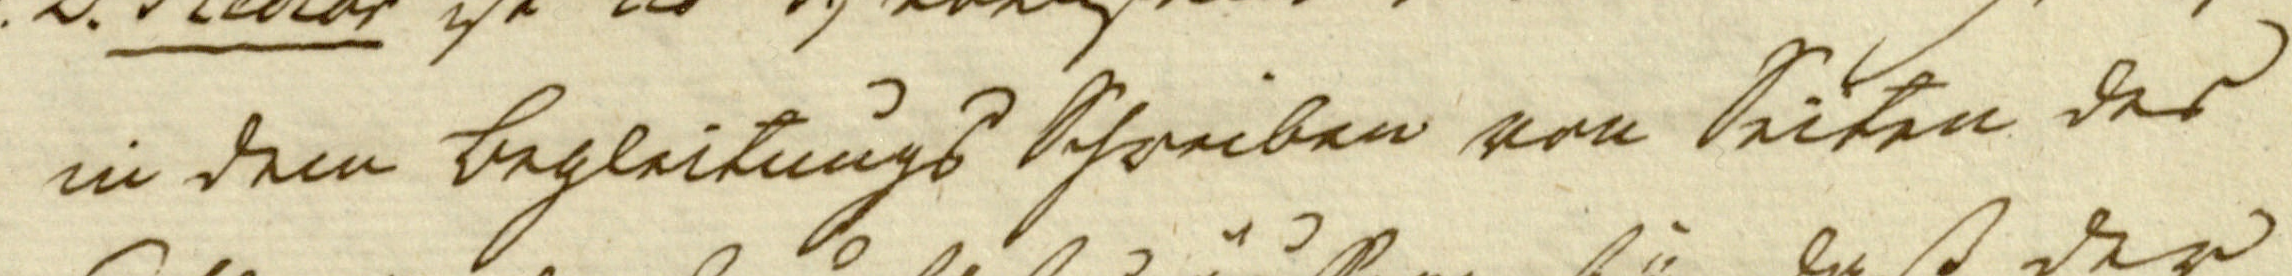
in dem Begleitungs Schreiben von Seiten der
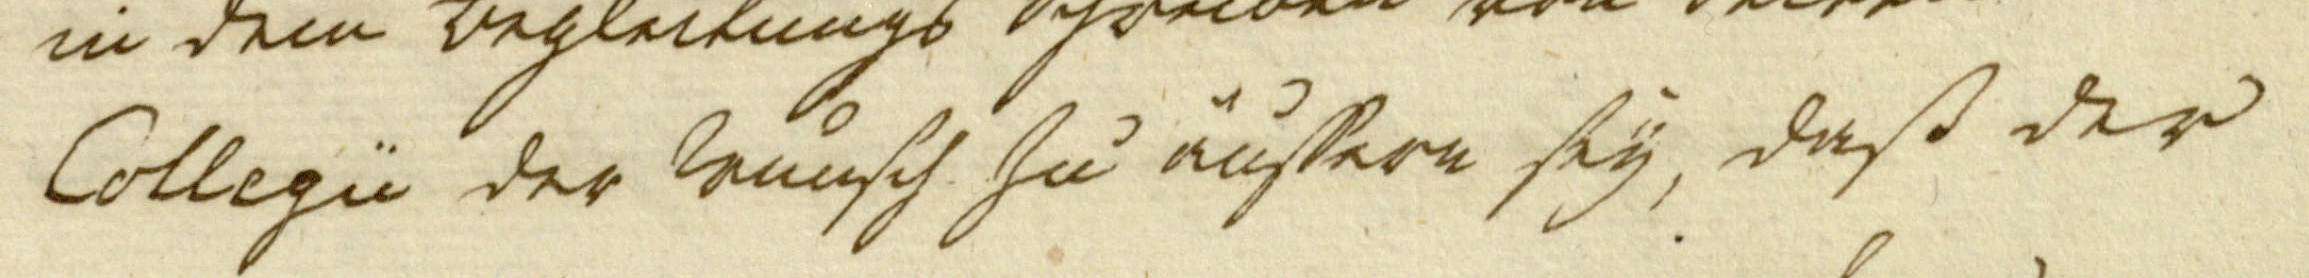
Collegii der Wunsch zu äussern seÿ, daß der
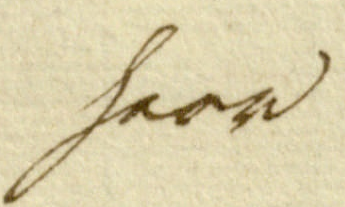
herr
